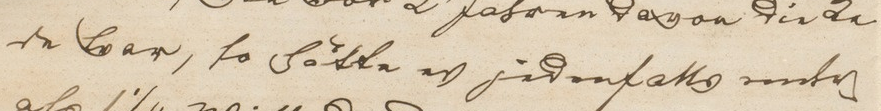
de war, so hätte es jedenfalls mehr
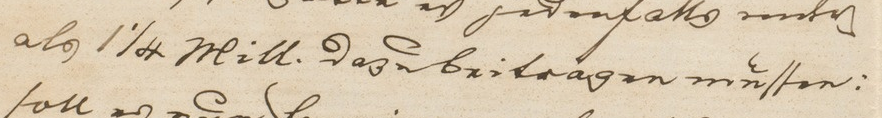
als 1¼ Mill. dazu beitragen müssen:
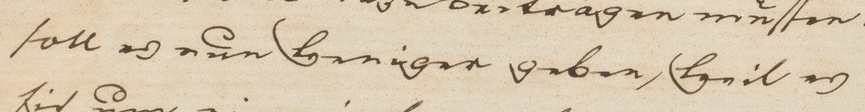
soll es nun weniger geben, weil es
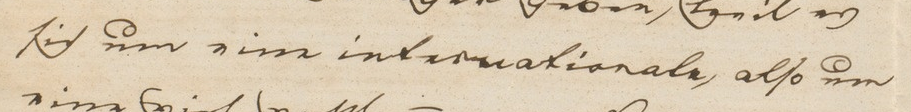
sich um eine internationale, also um
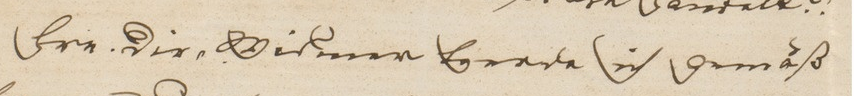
Hrn. Dir. Widmer werde ich gemäß
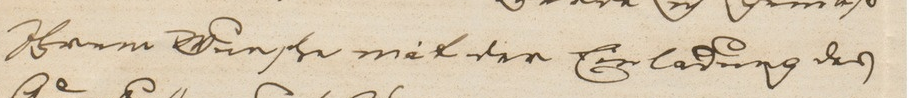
Ihrem Wunsche mit der Einladung des
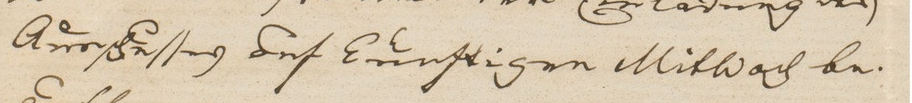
Ausschusses auf künftigen Mitwoch be-
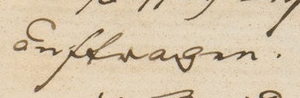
auftragen.
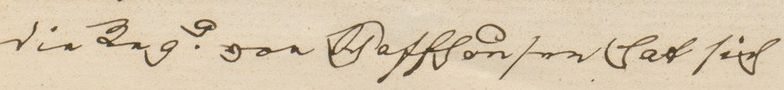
Die Regg von Schaffhausen hat sich
